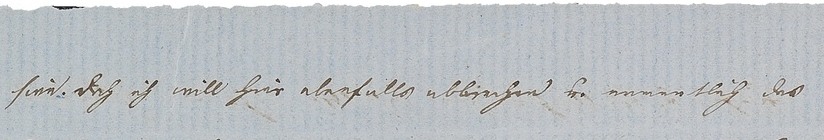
abbrechen u. namentlich
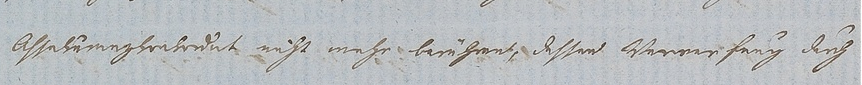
Assekuranzkonkordat nicht mehr berühren, dessen Verwerfung durch
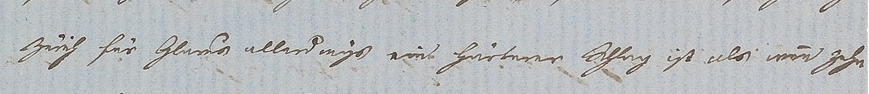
Zürich für Glarus allerdings ein härterer Schlag ist als wenn zehn
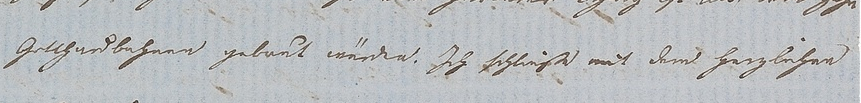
Gotthardbahnen gebaut würden. Ich schließe mit dem herzlichen
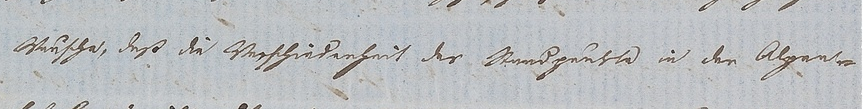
Wunsche, daß die Verschiedenheit der Standpunkte in der Alpen -
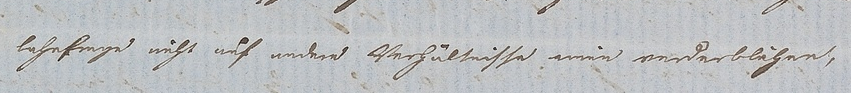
bahnfrage nicht auf andere Verhältnisse einen verderblichen,
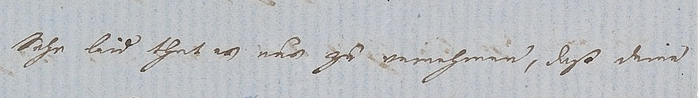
Sehr leid thut es uns zu vernehmen, daß Deine
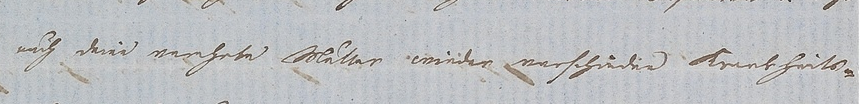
auch Deine verehrte Mutter wieder verschiedne Krankheits-
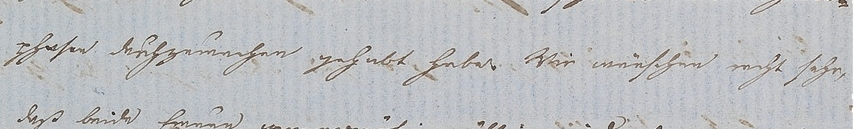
phasen durchzumachen gehabt habe. Wir wünschen recht sehr,
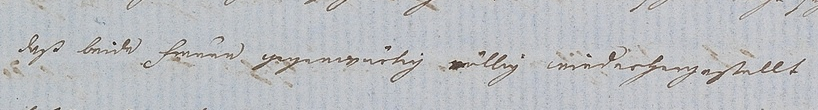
daß beide Frauen gegenwärtig völlig wiederhergestellt
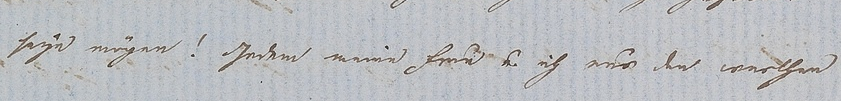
seyn mögen! Indem meine Frau u. ich uns den werthen
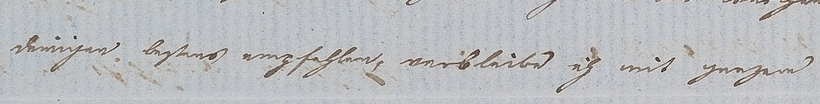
Deinigen bestens empfehlen, verbleibe ich mit ganzem
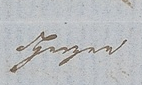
Herzen
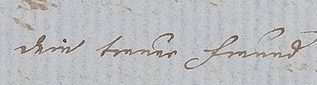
Dein treuer Freund
